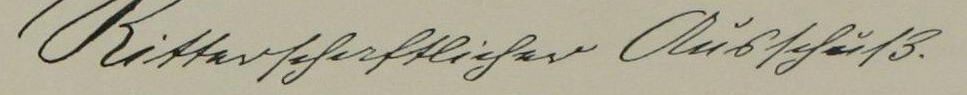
Ritterschaftlicher Ausschuß
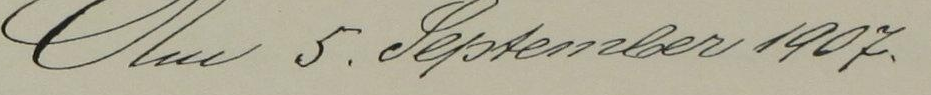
Am 5. September 1907.
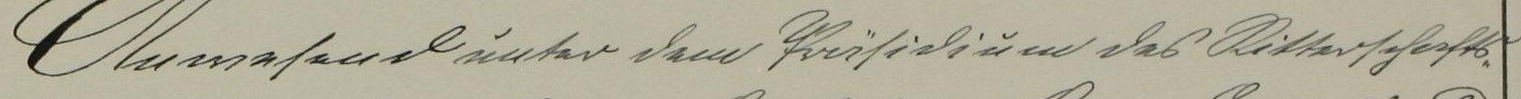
Anwesend unter dem Präsidium des Ritterschafts-
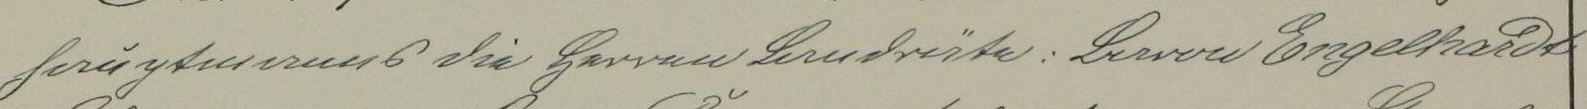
hauptmanns die Herren Landräte: Baron Engelhardt
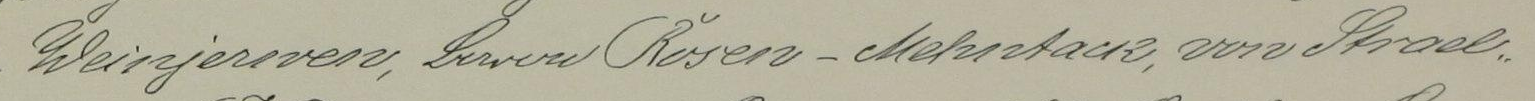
-Weinjerwen, Baron Rosen-Mehntack, von Strael-
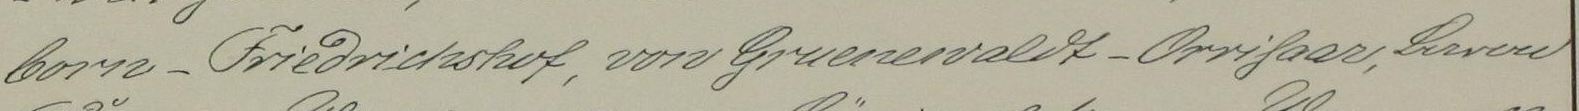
born-Friedrichshof, von Gruenewaldt-Orrisaar, Baron
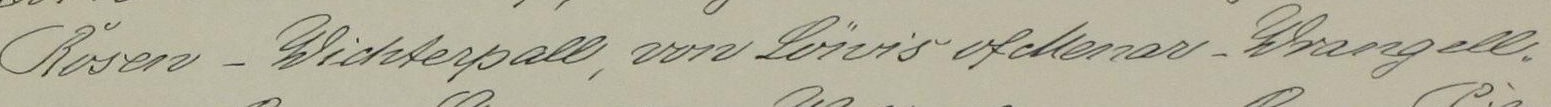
Rosen-Wichterpall, von Löwis of Menar-Wrangell-
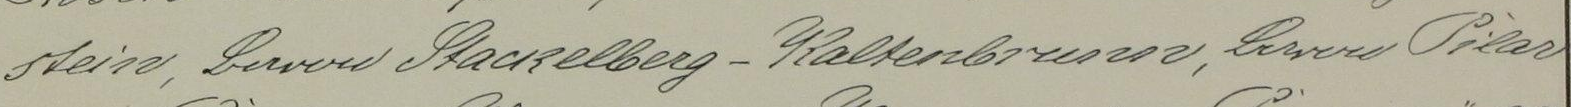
stein, Baron Stackelberg-Kaltenbrunn, Baron Pilar
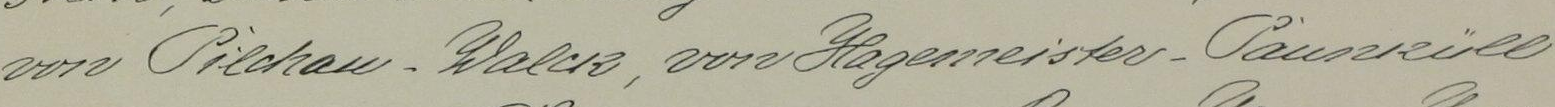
von Pilchau-Walck, von Hagemeister-Paunküll
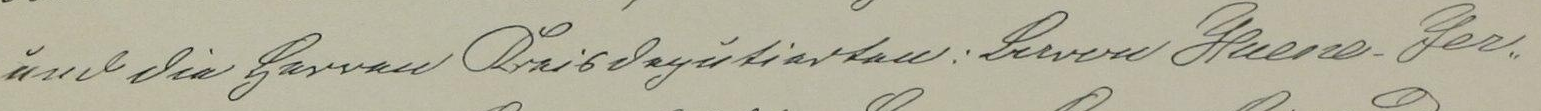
und die Herren Kreisdeputierten: Baron Huene-Jer-
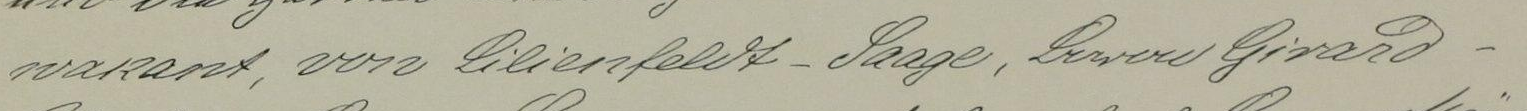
wakant, von Lilienfeldt-Saage, Baron Girard-
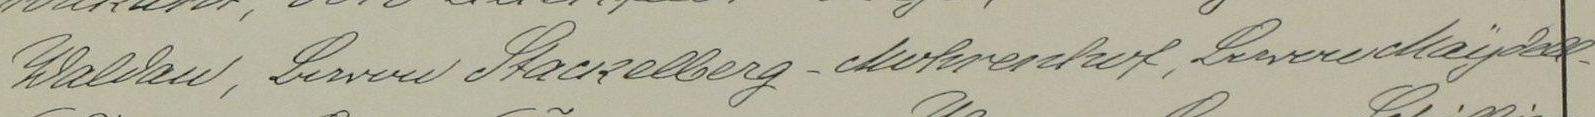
Waldau, Baron Stackelberg-Mohrenhof, Baron Maydell-
